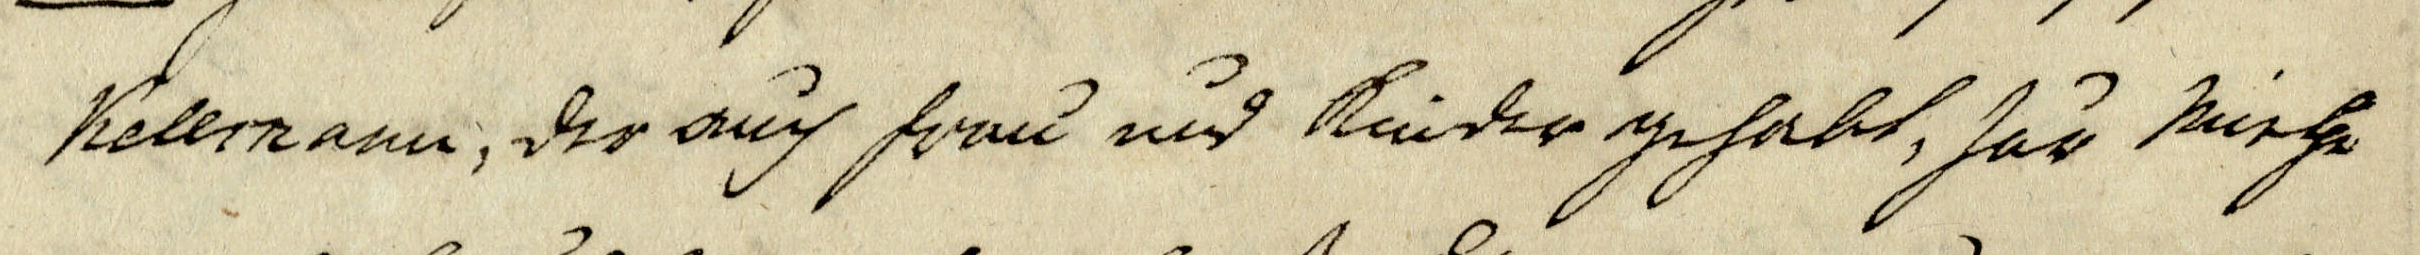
Kellmann, der auch Frau und Kinder gehabt, zur Miethe
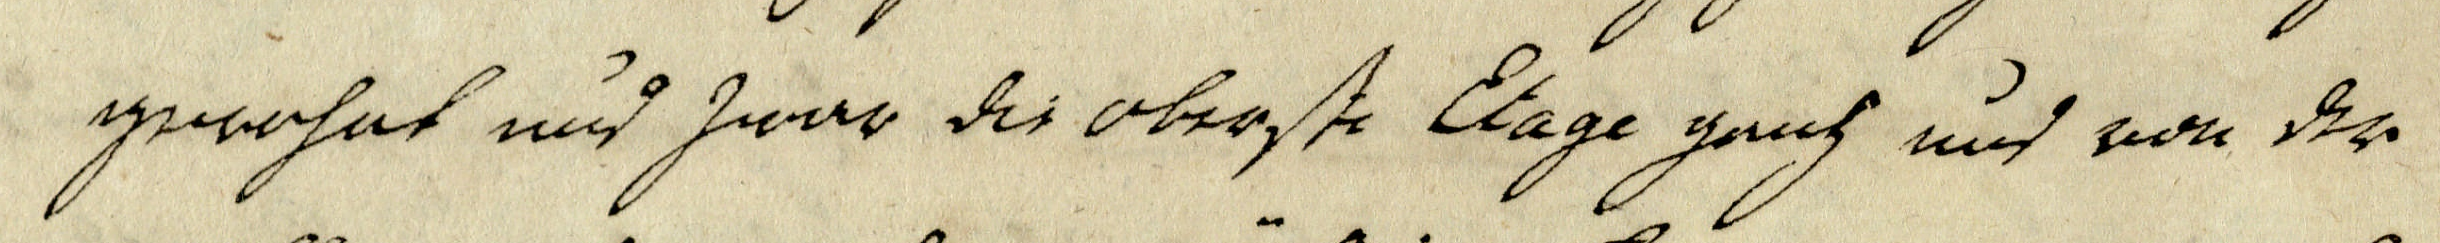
gewohnt und zwar die oberste Etage ganz und von der
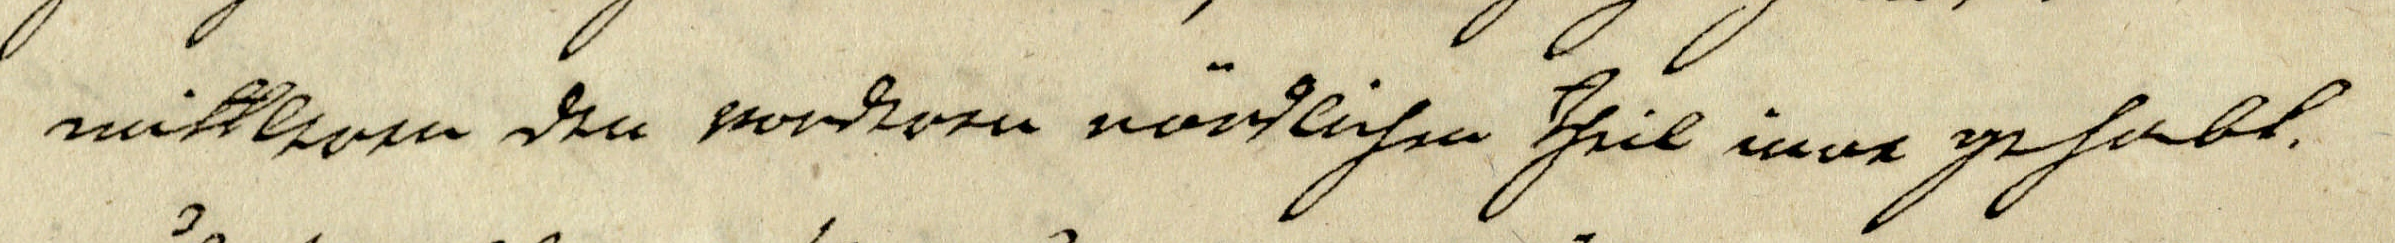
mittleren den vorderen nördlichen Theil inne gehabt,
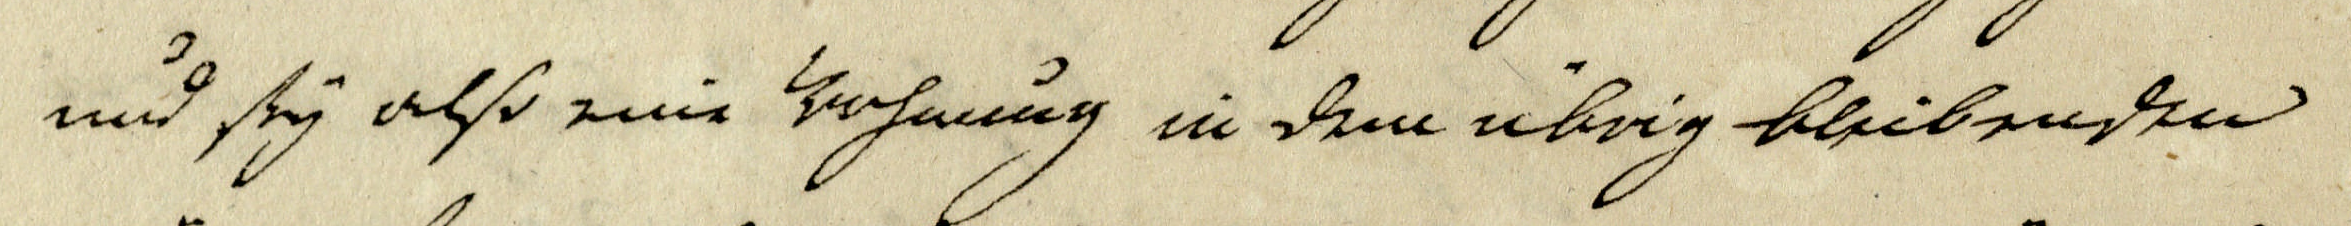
und seÿ also eine Wohnung in dem übrig bleibenden
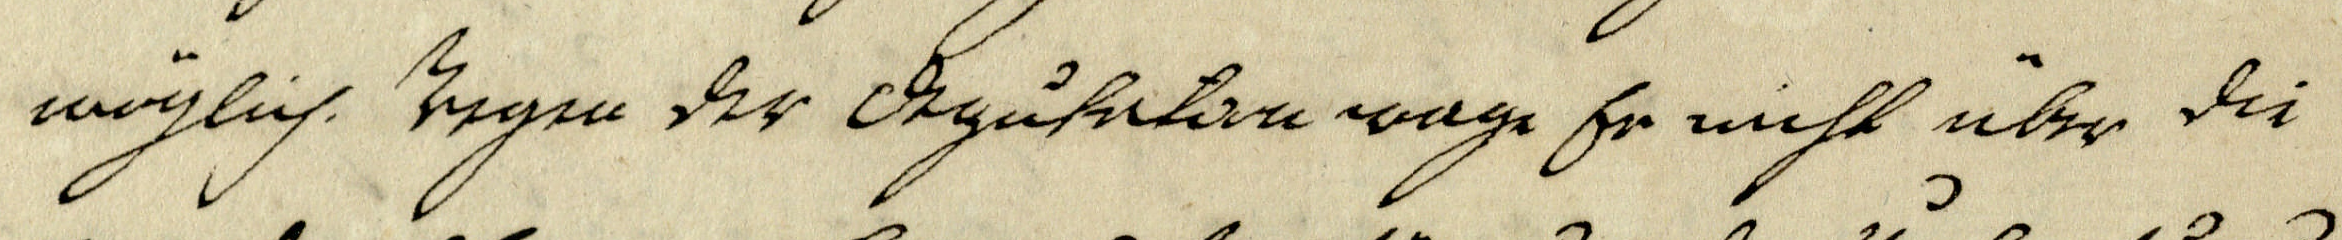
möglich. Wegen der Deputation wage Er nicht über die
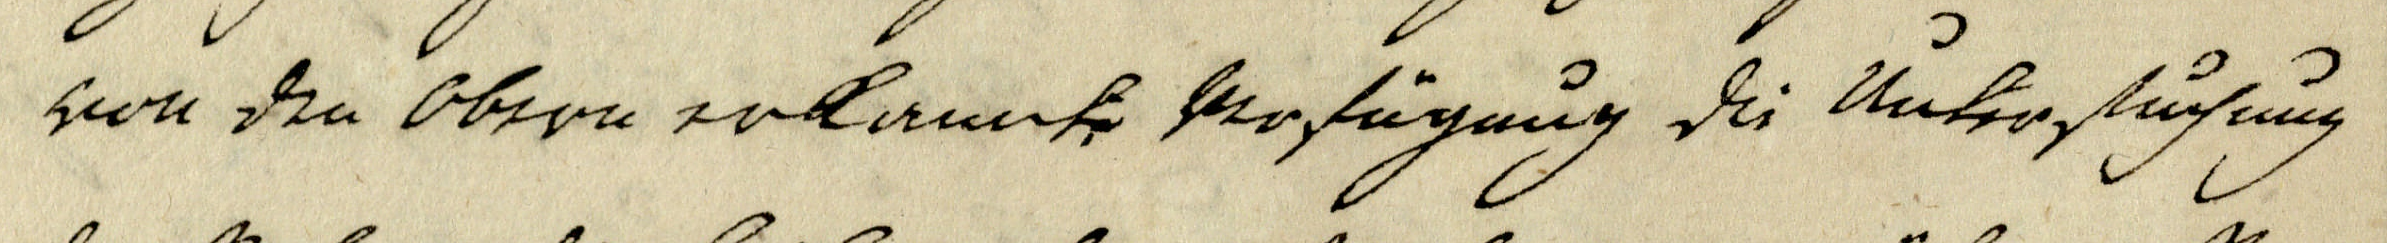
von den Obern erkannte Verfügung die Untersuchung
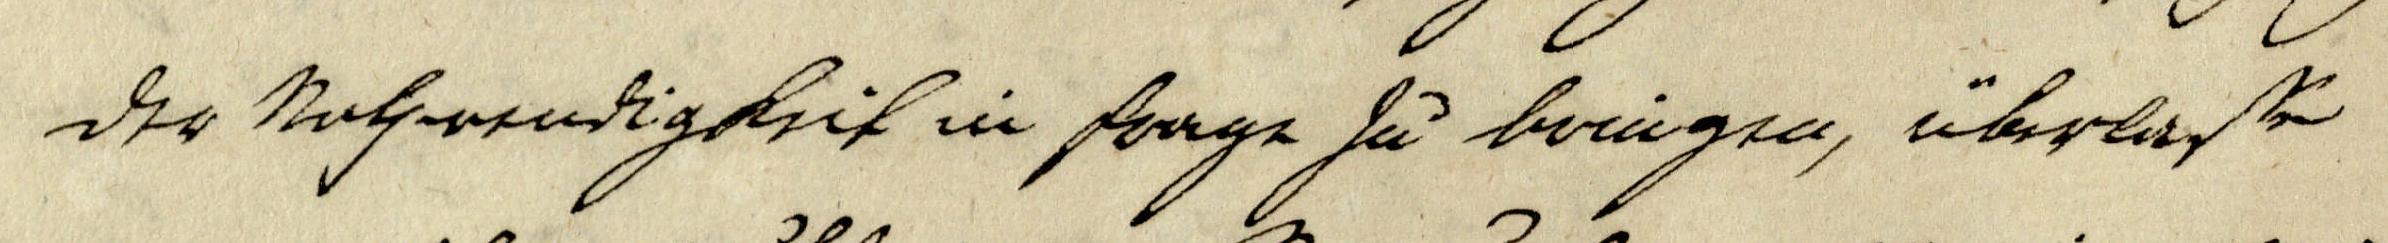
der Nothwendigkeit in frage zu bringen, überlasse
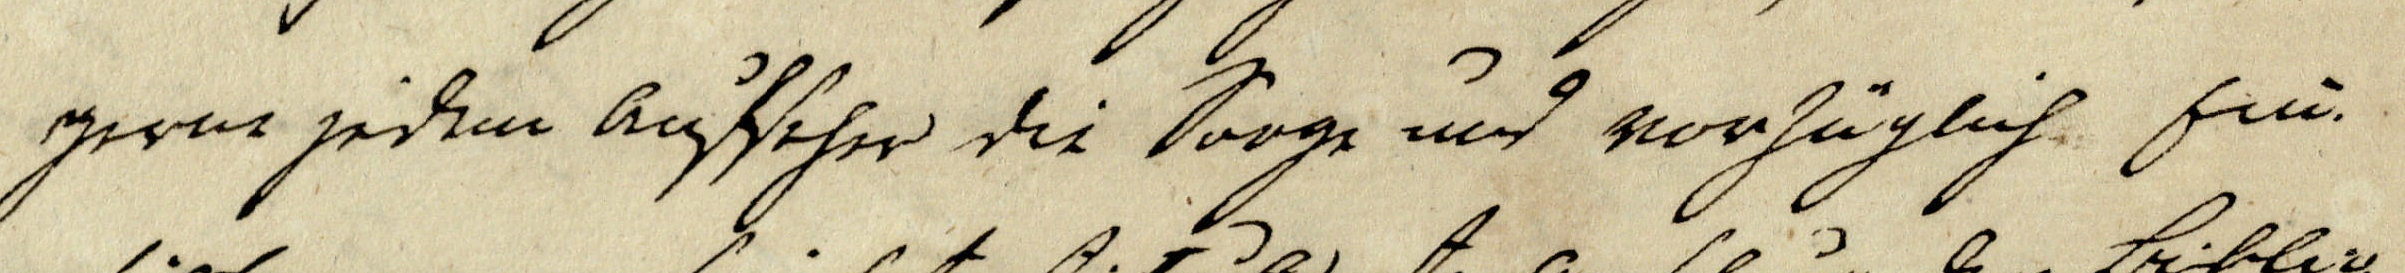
gerne jedem Aufseher die Sorge und vorzüglich Ein¬
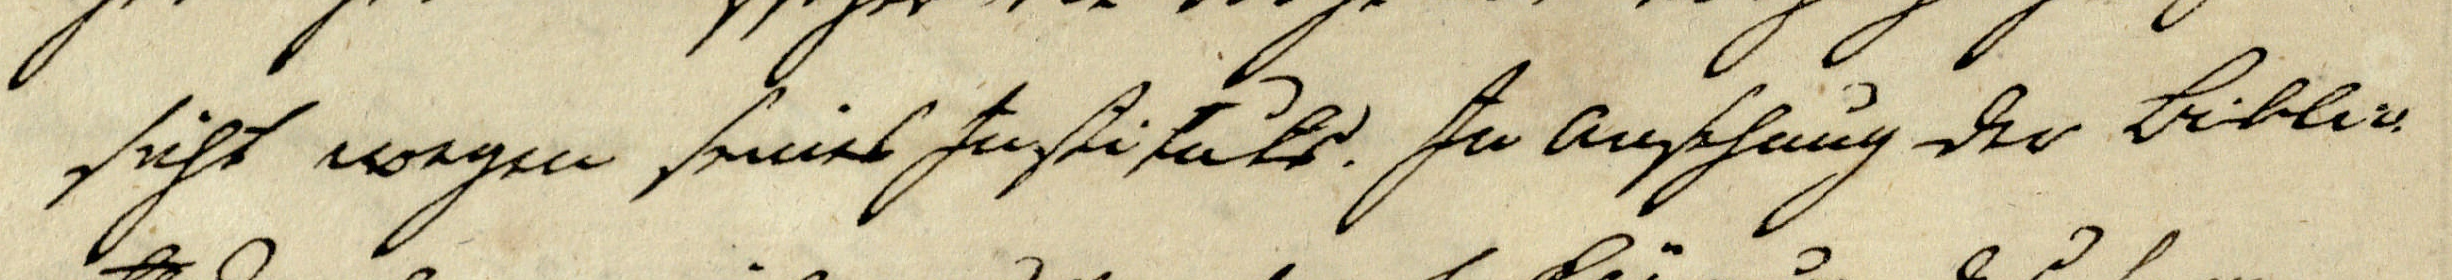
sicht wegen seines Instituts. In Ansehung der Biblio¬
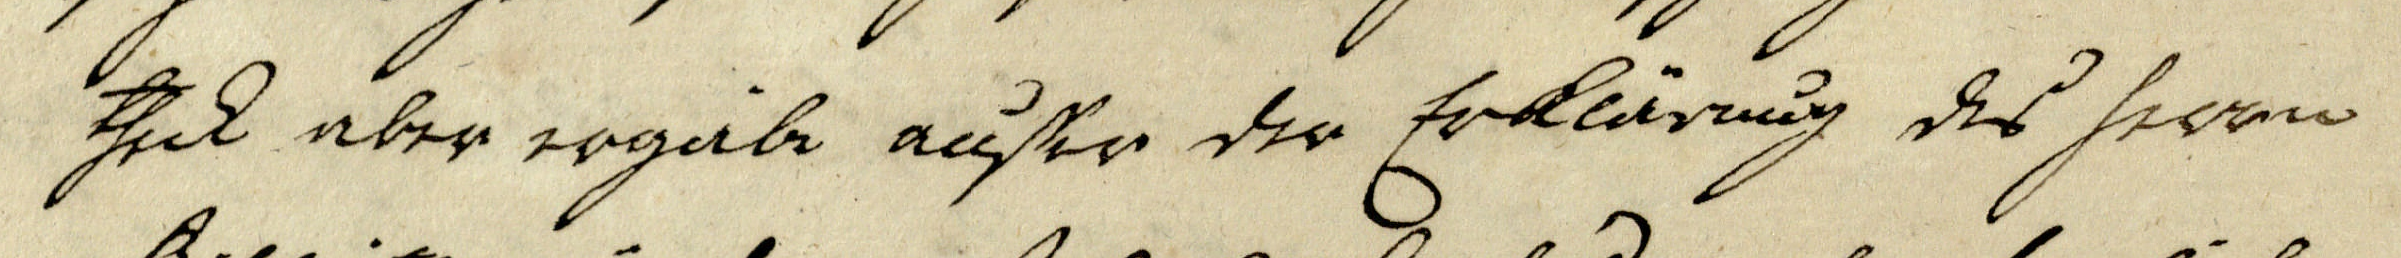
thek aber ergäbe ausser der Erklärung des Herrn
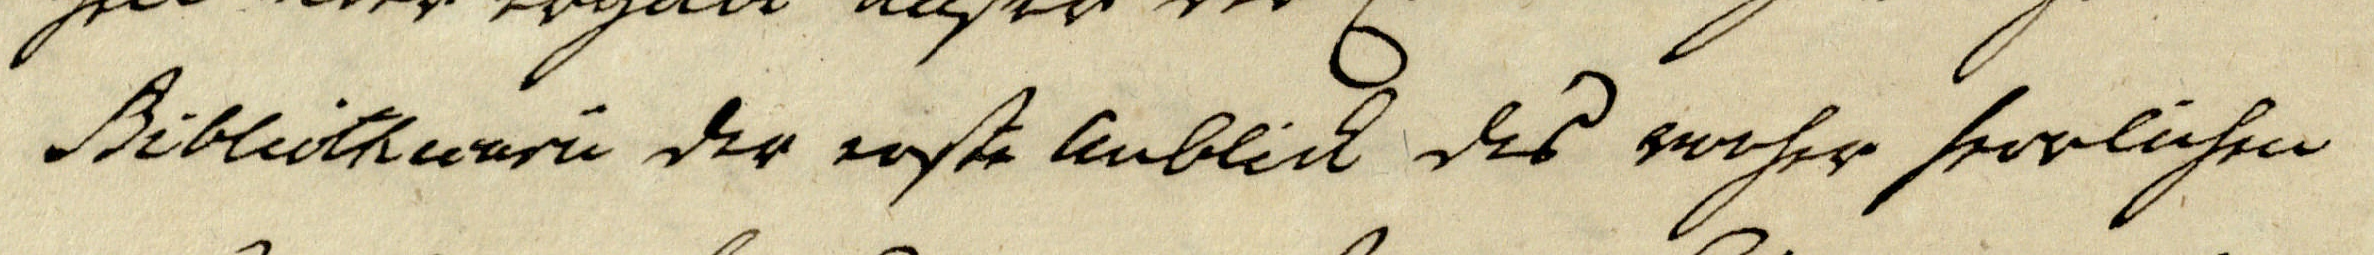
Bibliothecarii der erste Anblick des vorher herrlichen
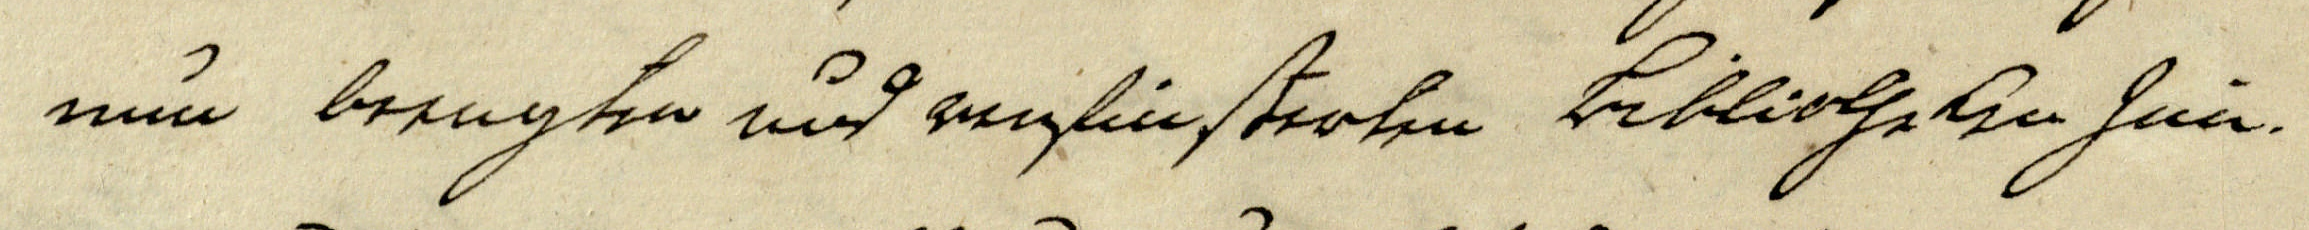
nun beengten und verfinsterten Bibliotheken Zim¬
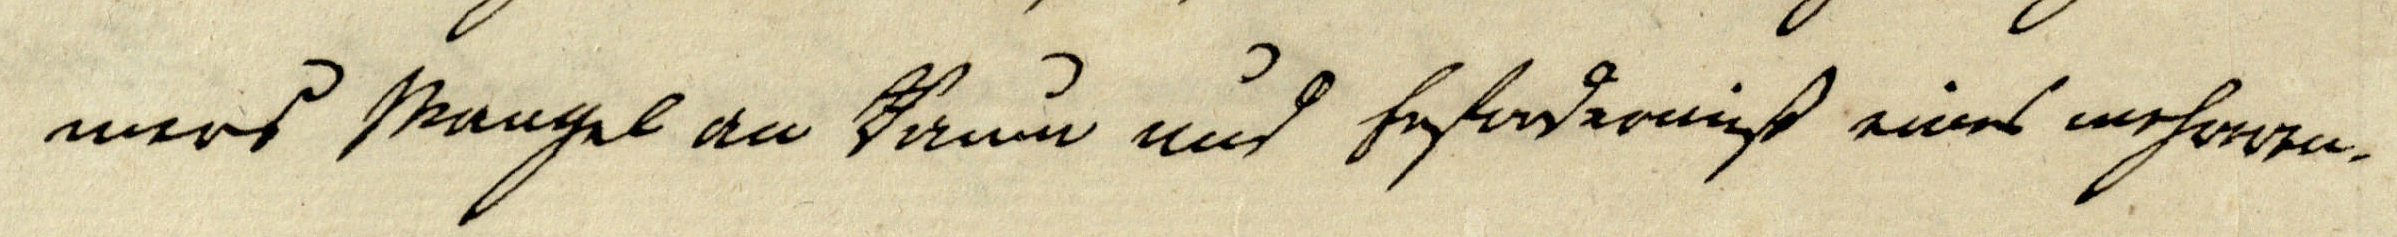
mers Mangel an Raum und Erforderniß eines mehreren.
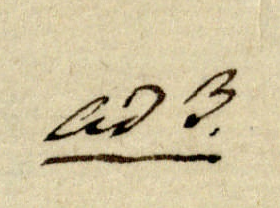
ad 3.
